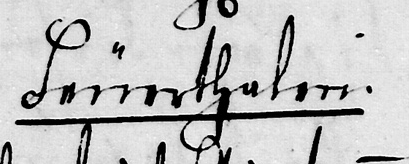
Feuerthalen.
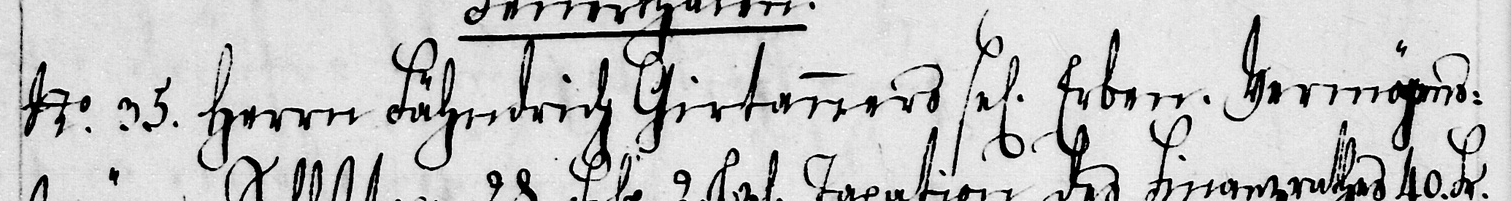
No. 35. Herrn Fähndrich Girtanners sel[ige] Erben.
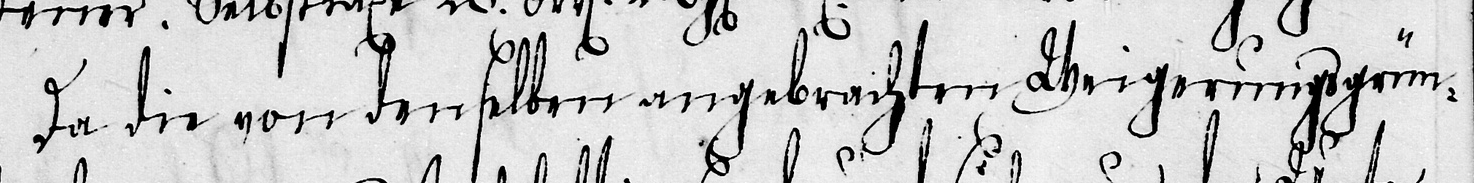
Da die von denselben angebrachten Weigerungsgrün¬
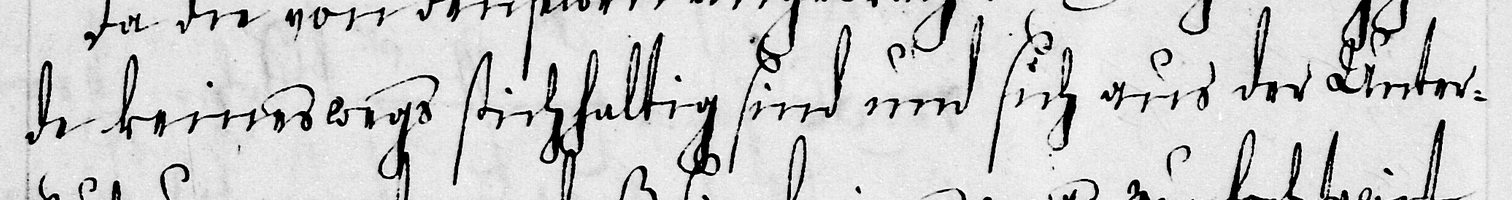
de keineswegs stichhaltig sind und sich aus der Unter¬
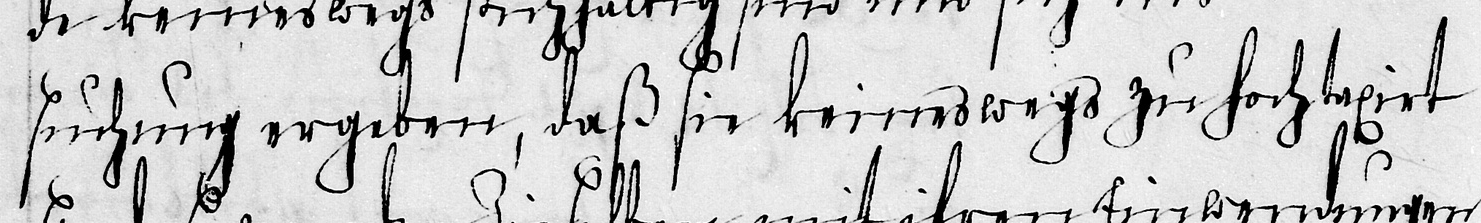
suchung ergeben, daß sie keineswegs zu hoch taxirt
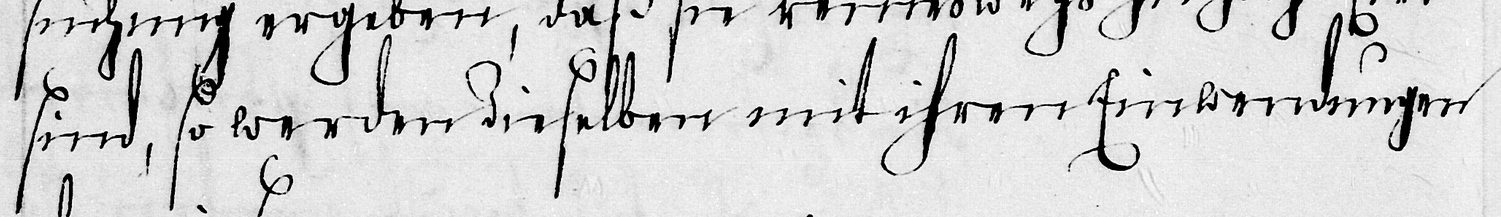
sind, so werden dieselben mit ihren Einwendungen
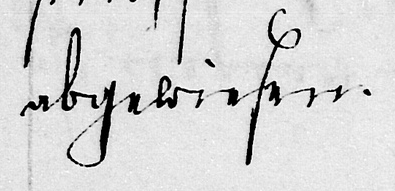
abgewiesen.
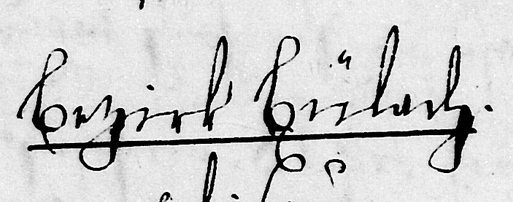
Bezirk Bülach.
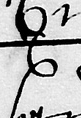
Fr.
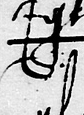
5.
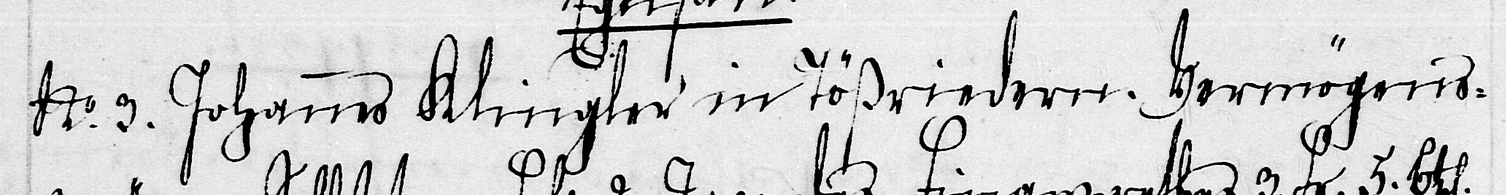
No. 3. Johannes Klingler in Tößriedern. Vermögens¬
